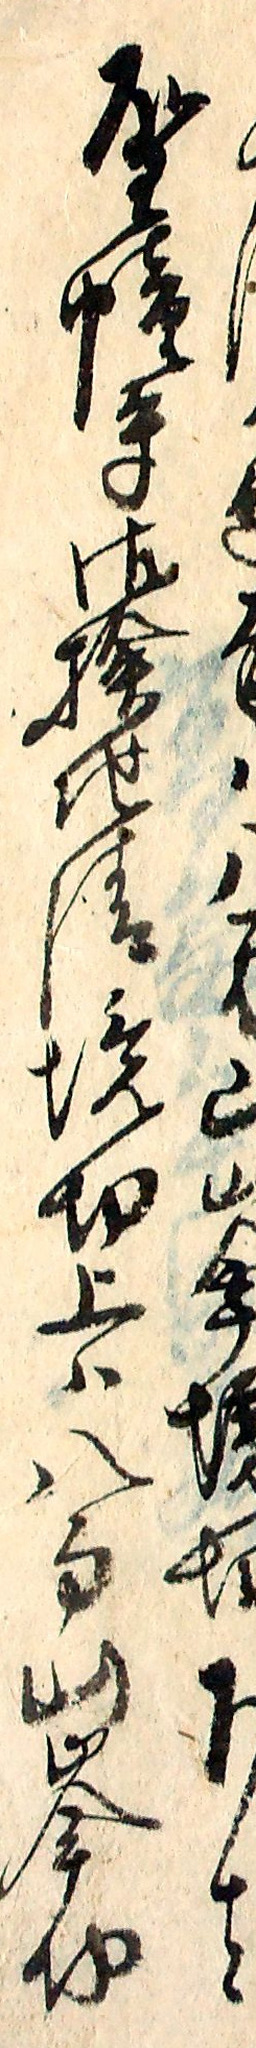聖幢寺御検地請境切上は八万山峯切

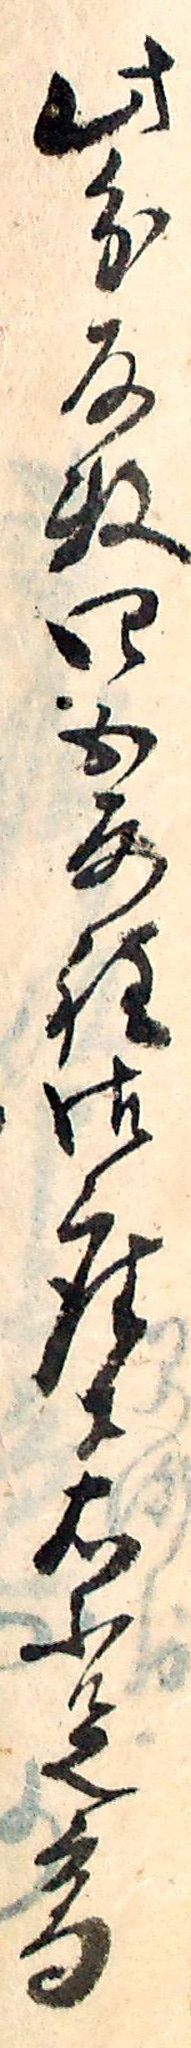此分反数四五反程御座候右不足高
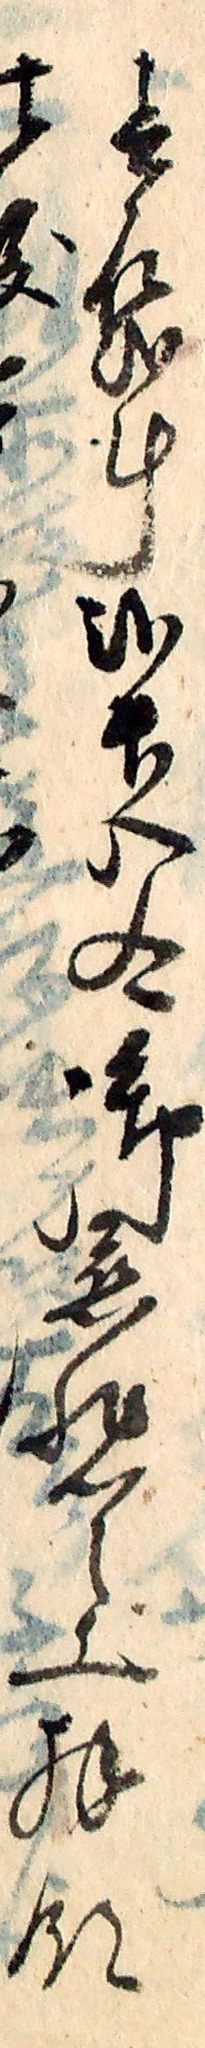壱石弐斗弐升八合御慈悲之上拝領
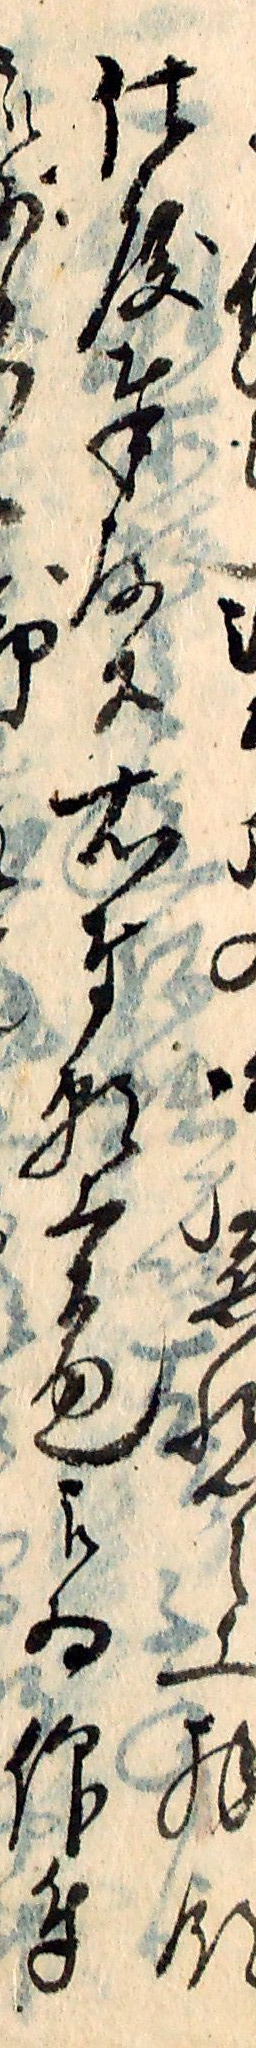仕度奉願候右奉願上候通被為仰付
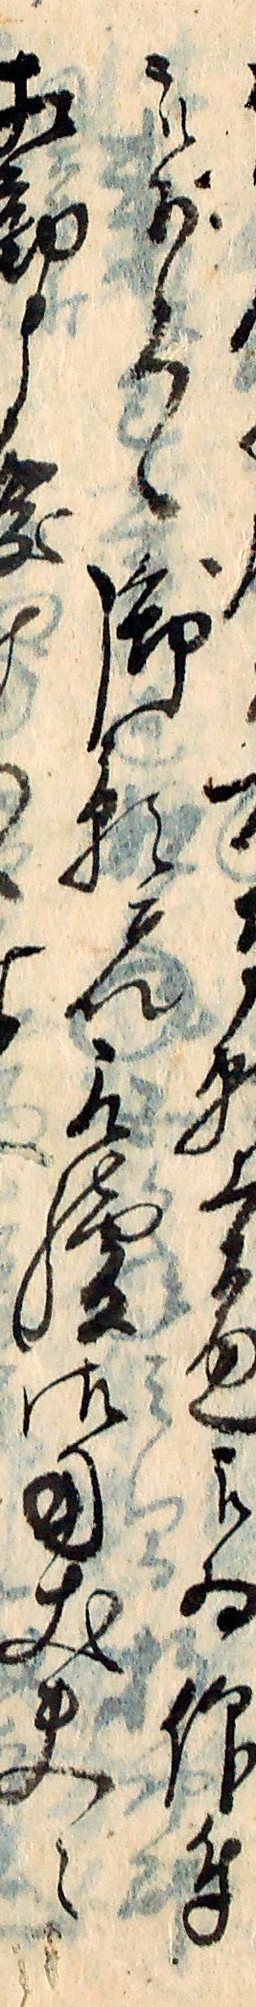被下候はゝ御影を以取続御用丈夫に
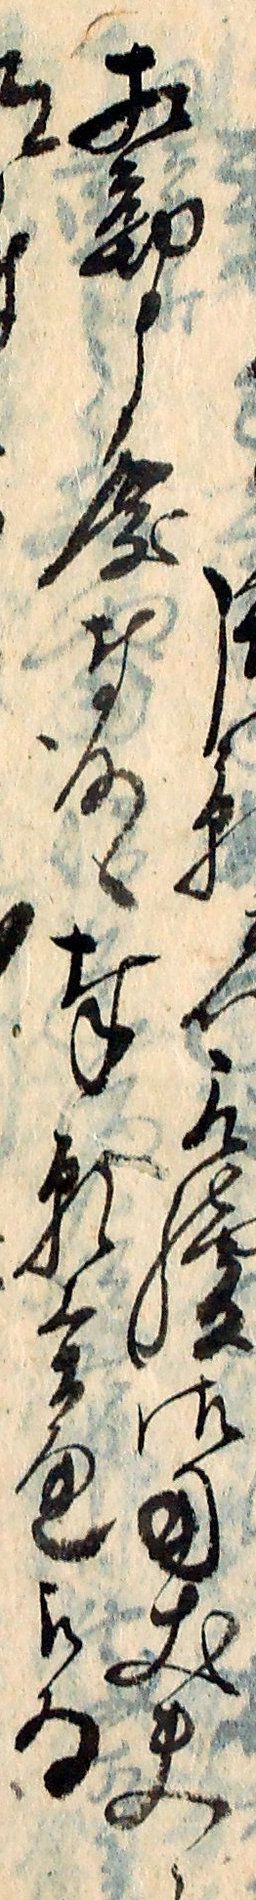相勤申度奉存候奉願上候通被為
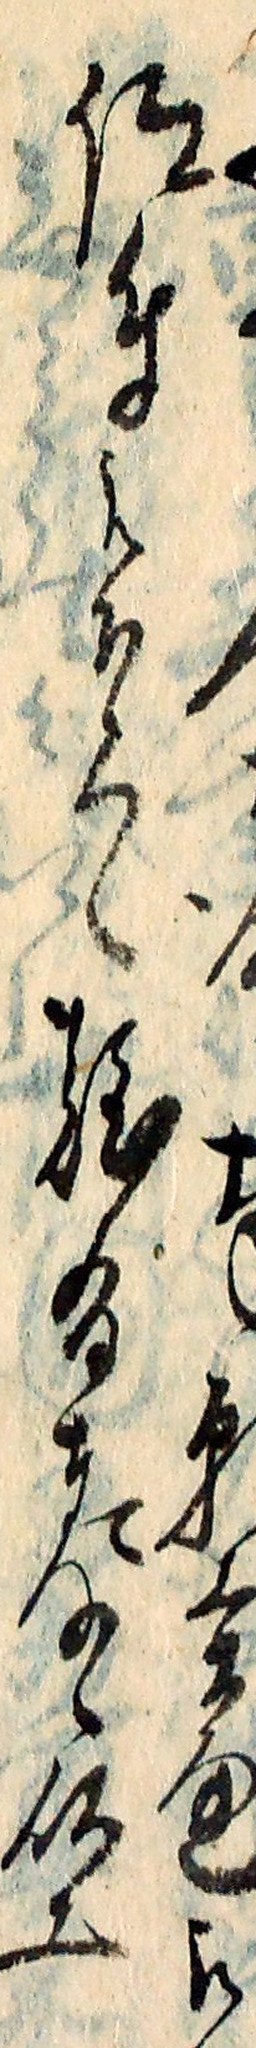仰付被下候はゝ難有奉存候以上
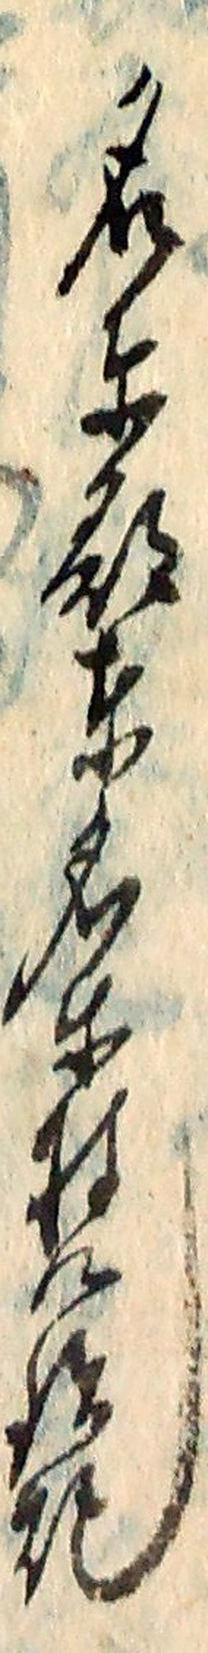名東郡東名東村郷鉄砲
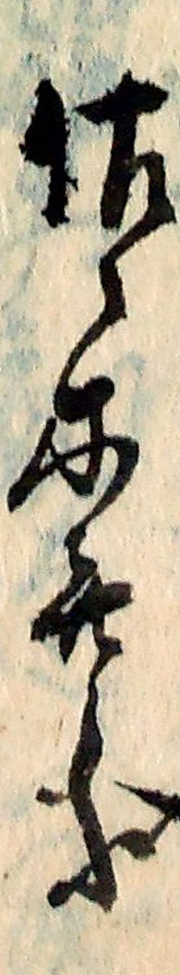佐々木喜兵衛
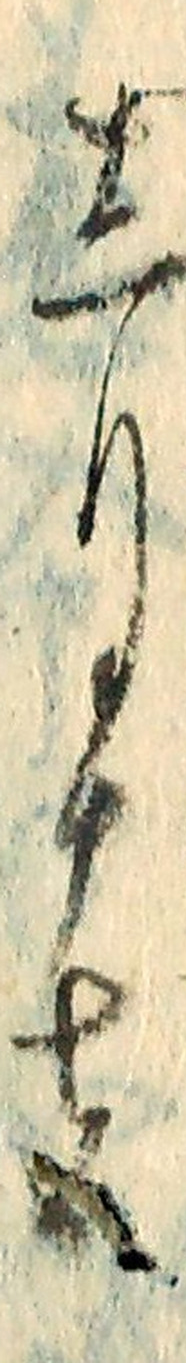十二月十七日
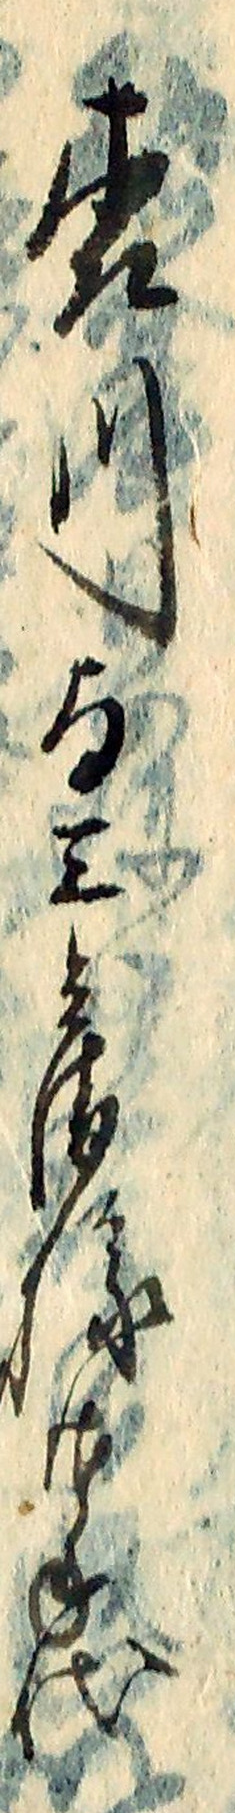春川与三兵衛様御手代
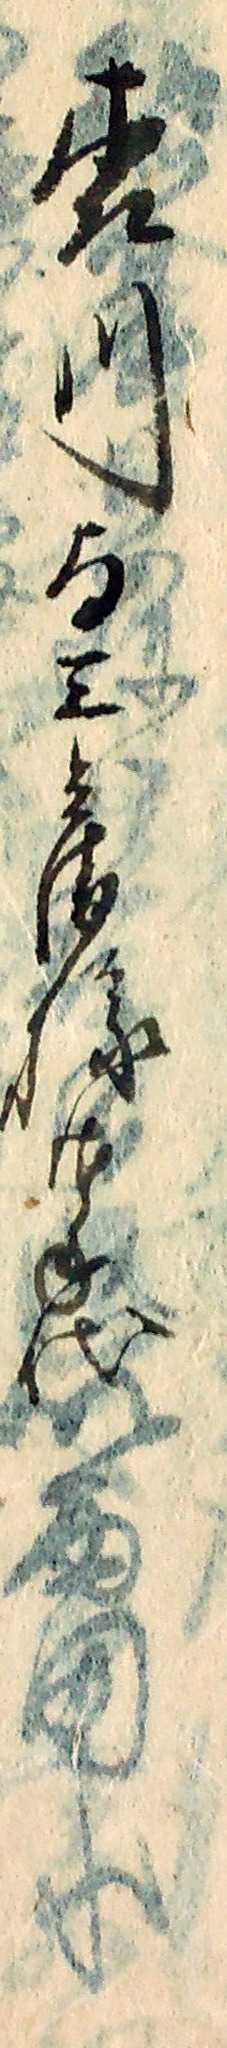春川与三兵衛様御手代
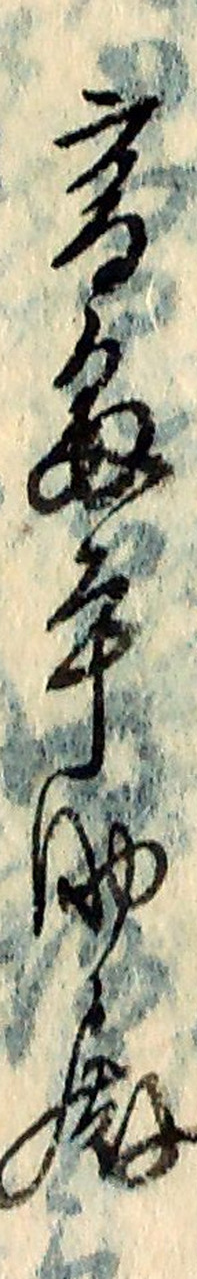高畠平助殿
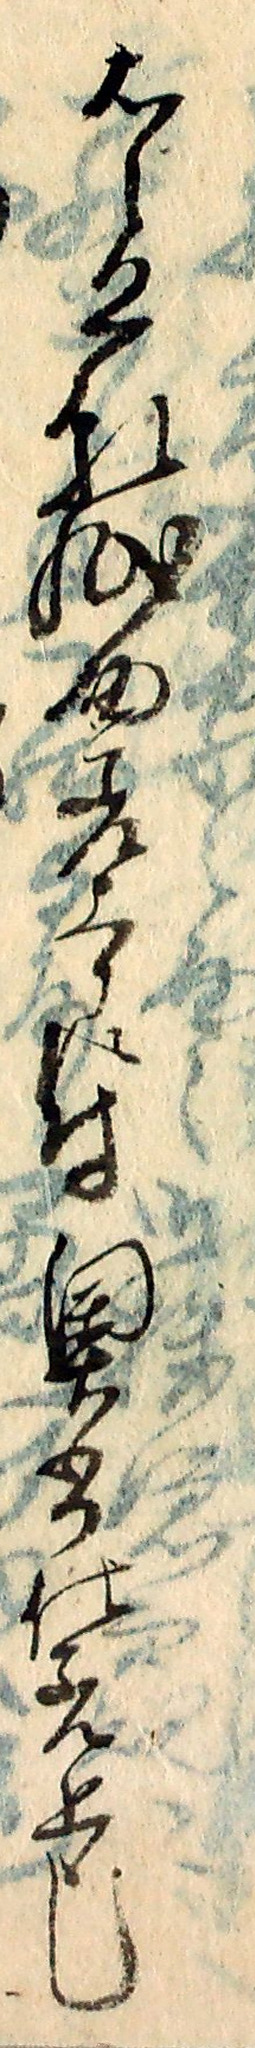右之通願紙面差上候に付奥書仕差上申候
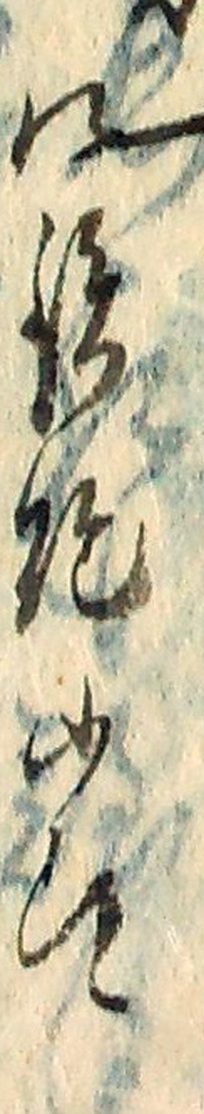郷鉄砲小頭
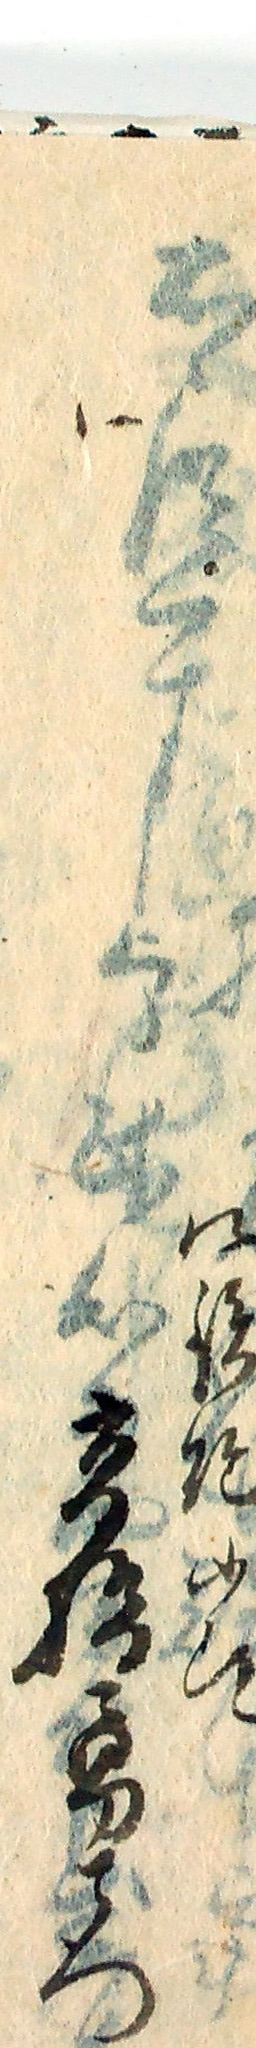高橋勇右衛門
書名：諸御願書控(後藤氏壱番）
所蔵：鳴門教育大学 Naruto University of Education
